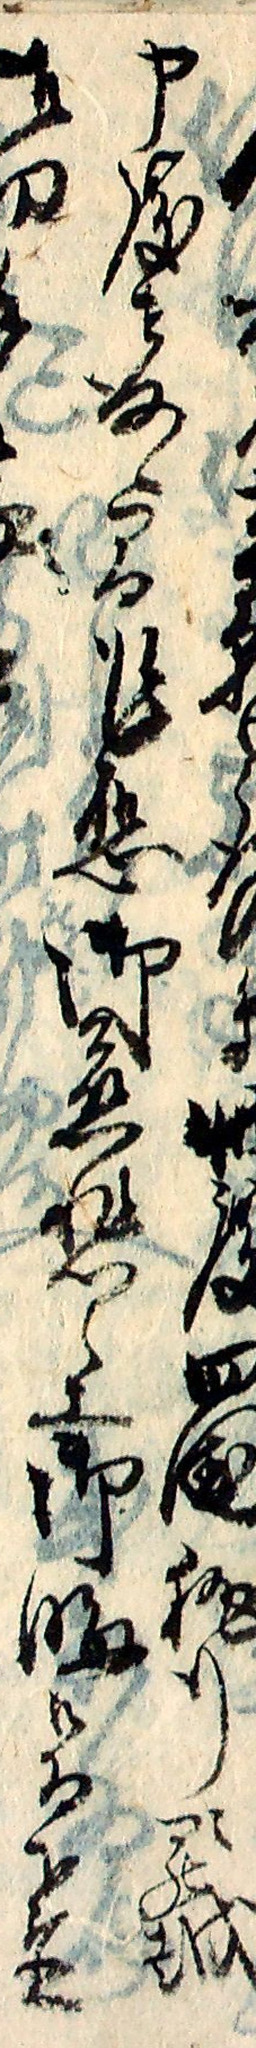申度奉存候間乍恐御慈悲之上御暇被為下置
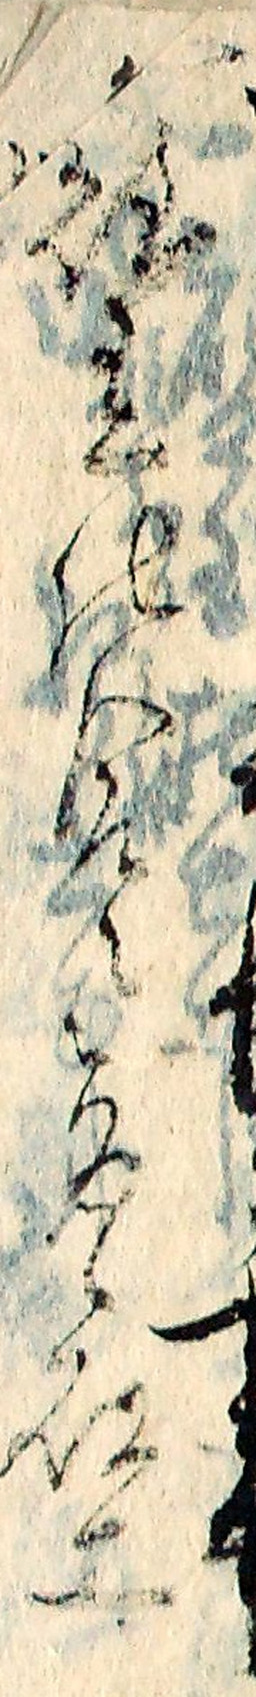難有仕合に奉存候以上

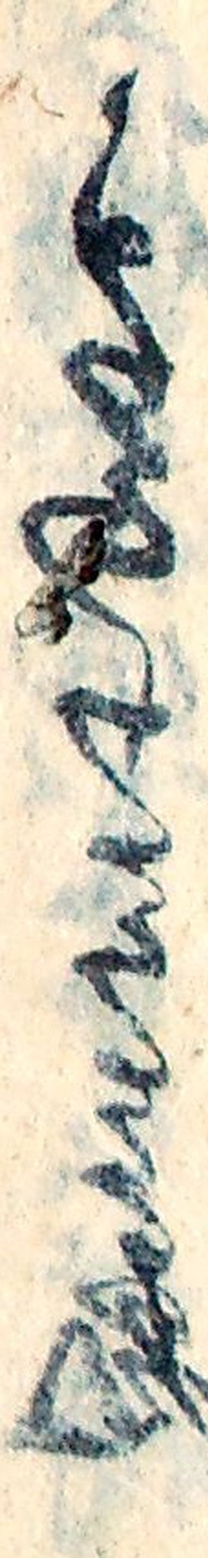与三郎
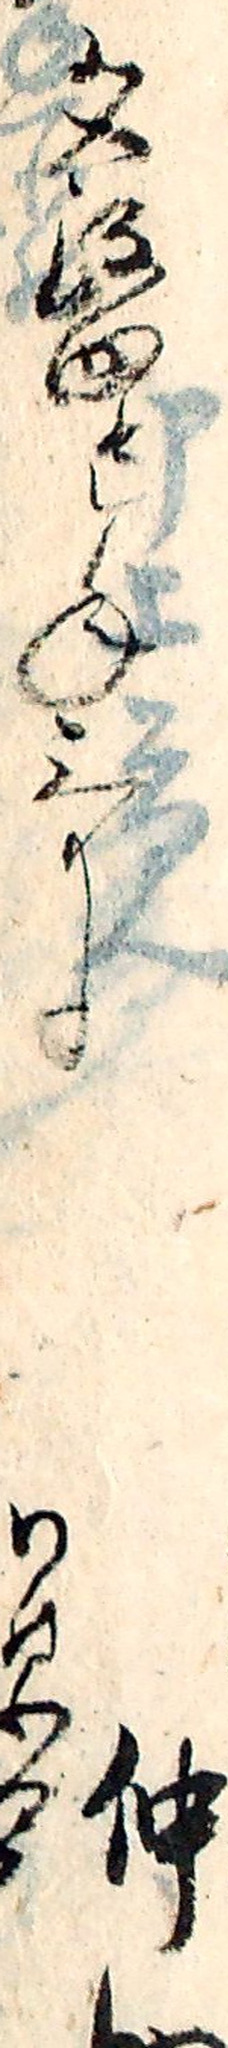文政四巳年三月同村庄屋
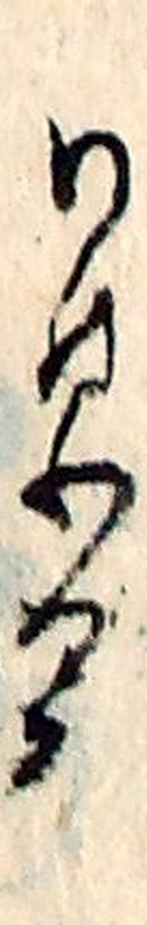同村五人与
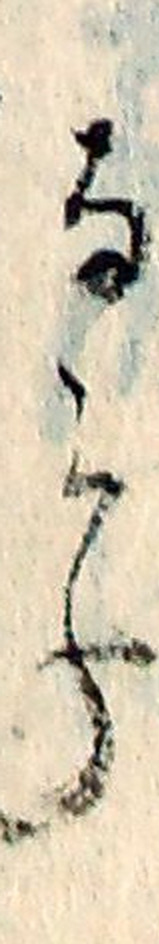与三郎
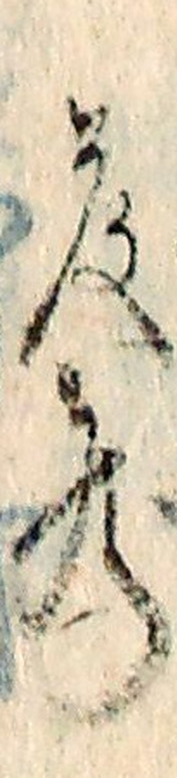利兵衛
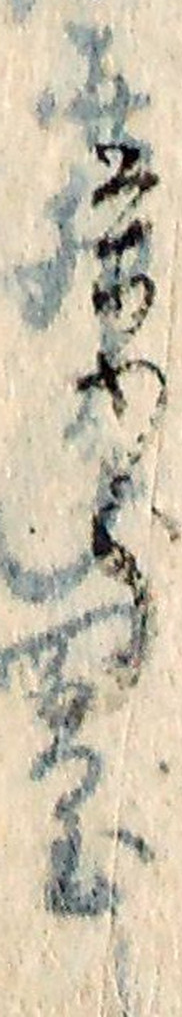与三郎
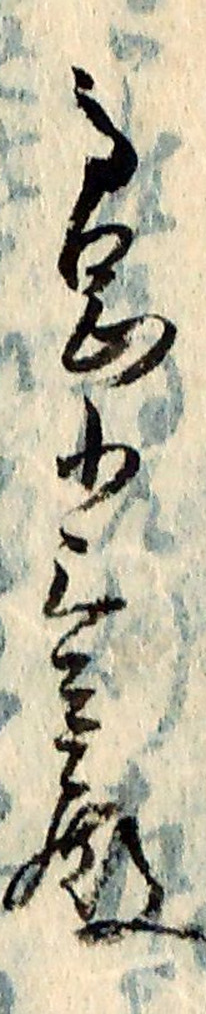高岡小三太殿
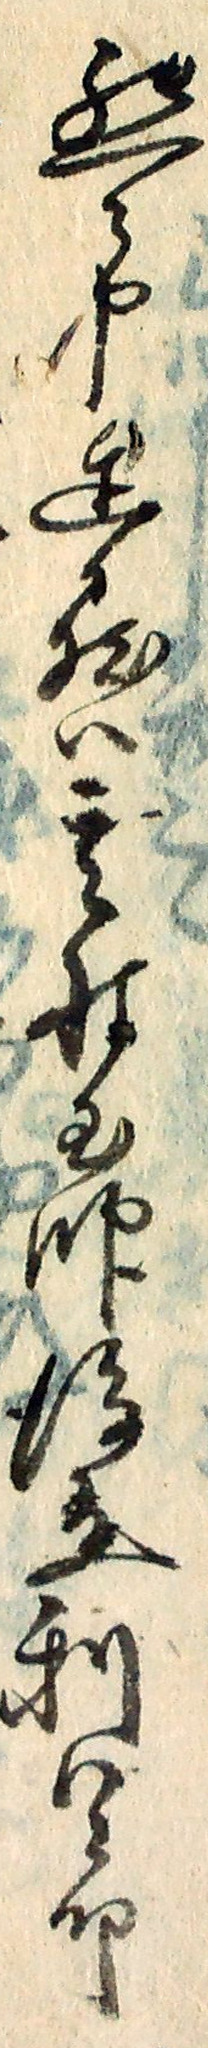態々申達候然は其村玉師後藤利八郎
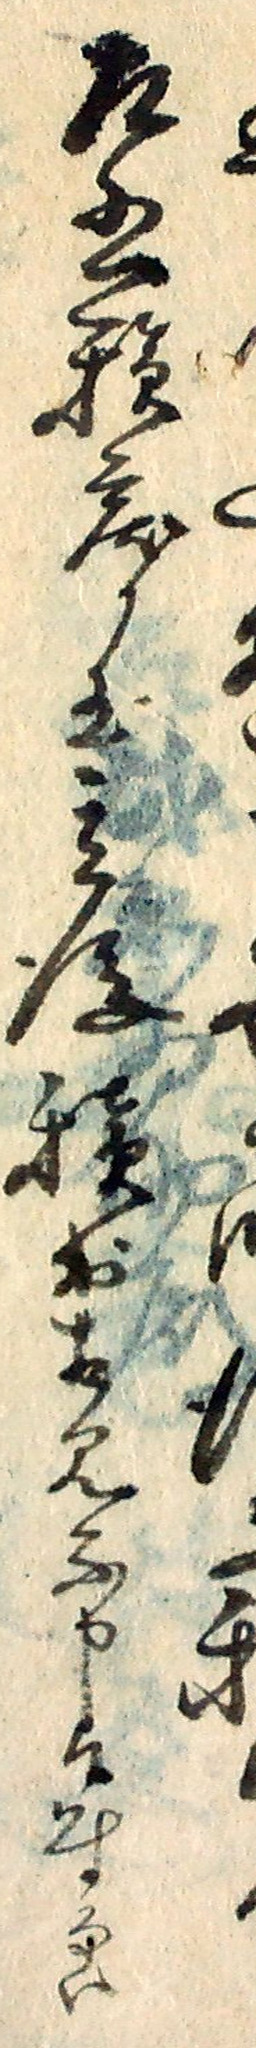左書積戻り玉其後積出相見不申上候付ては
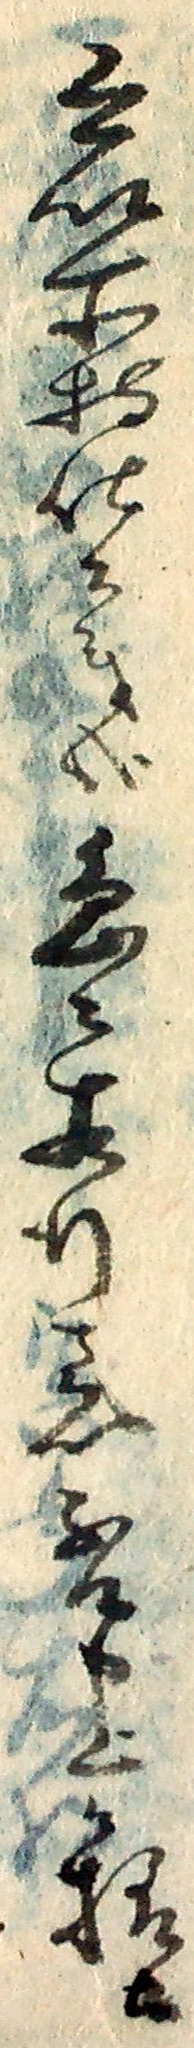今以所持仕候義哉急々相行着否申上候様被
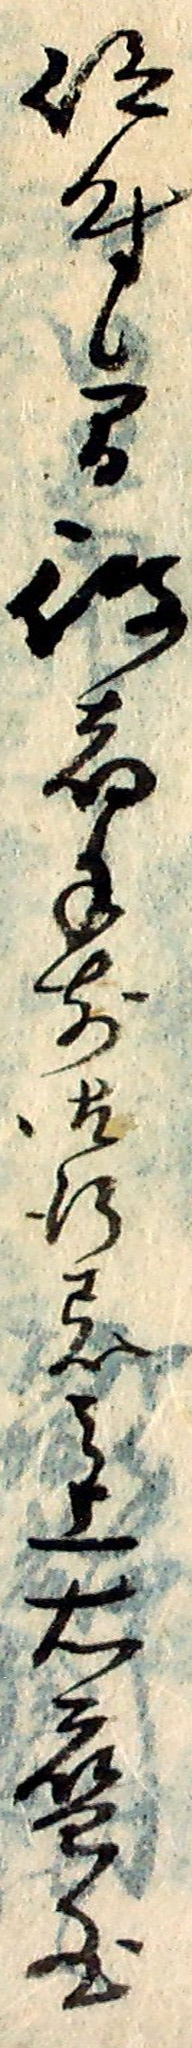仰付候間彼者手前御行着之上右藍玉
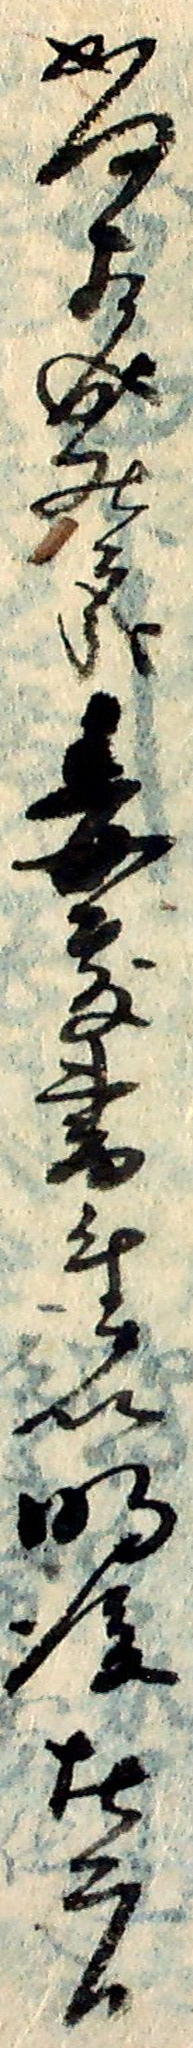如何相成居候哉委敷書付を以明後廿二日
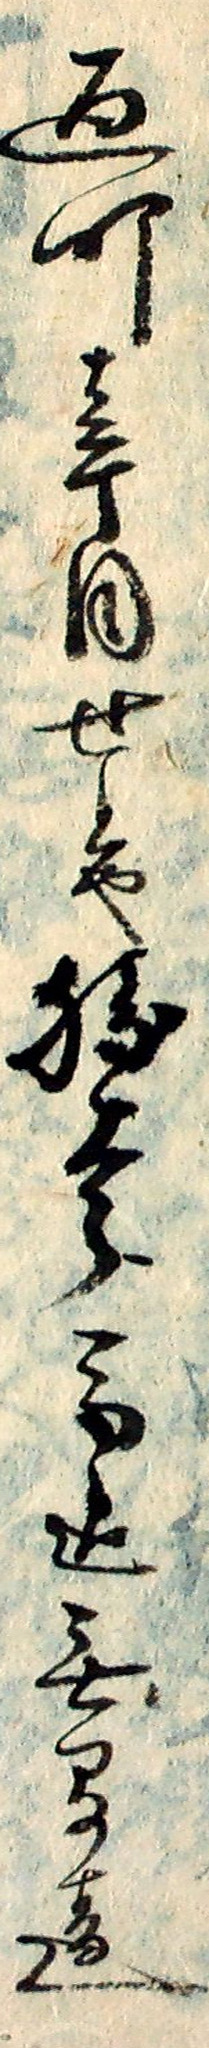通町壱丁目せとや勝太郎方迄無間違
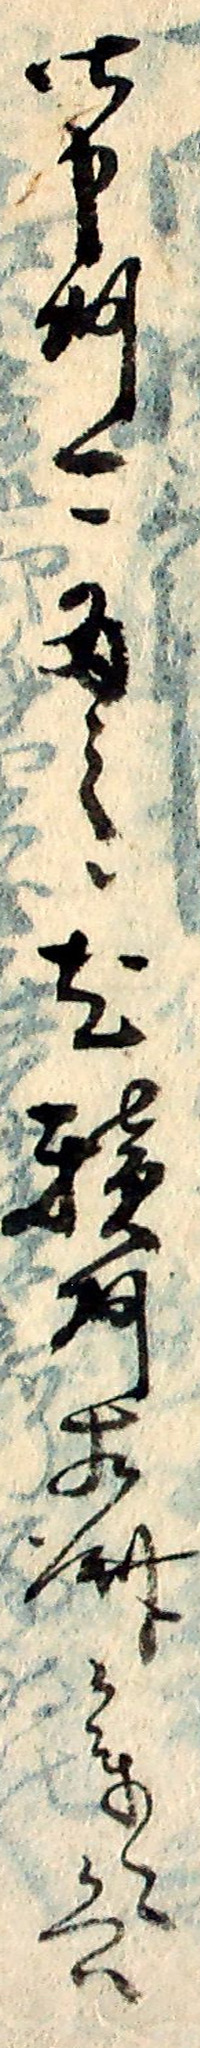御申出し可有之候尤積出し相済候義に候へは
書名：諸御願書控(後藤氏壱番）
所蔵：鳴門教育大学 Naruto University of Education
